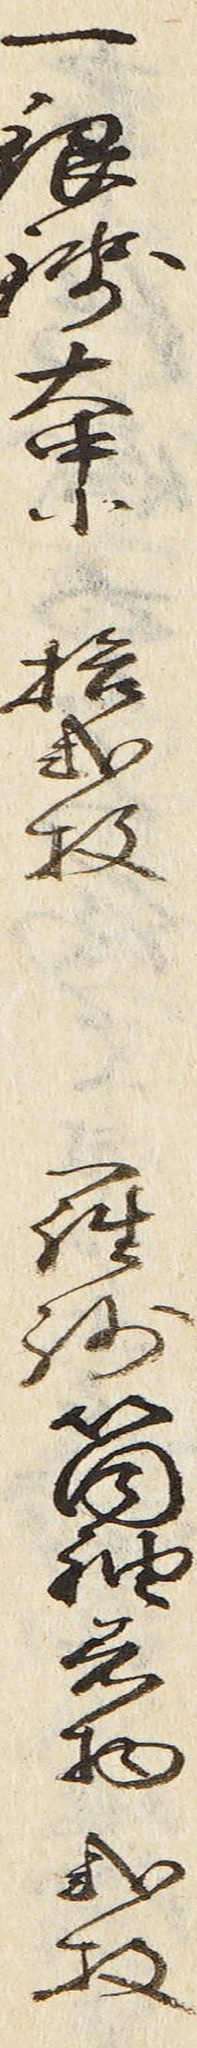一銀銭代中小拾弐枚羅紗筒袖着物弐枚
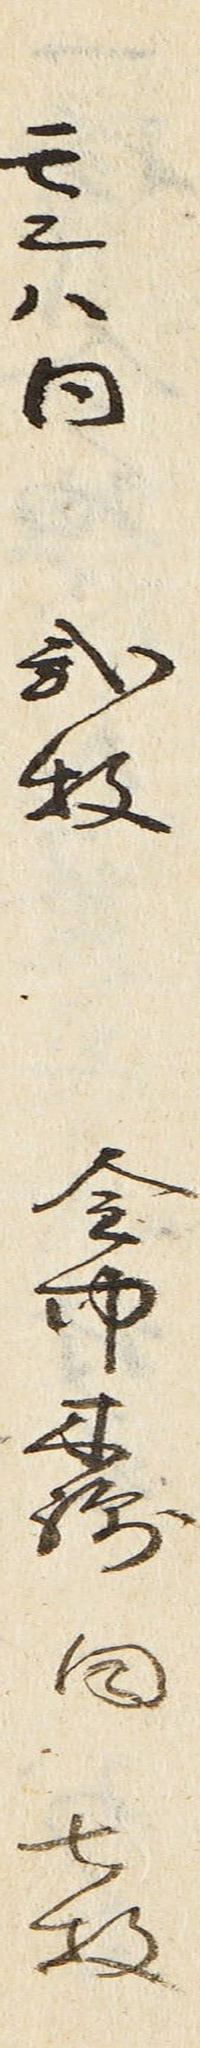モンハ同弐枚金巾木綿同七枚
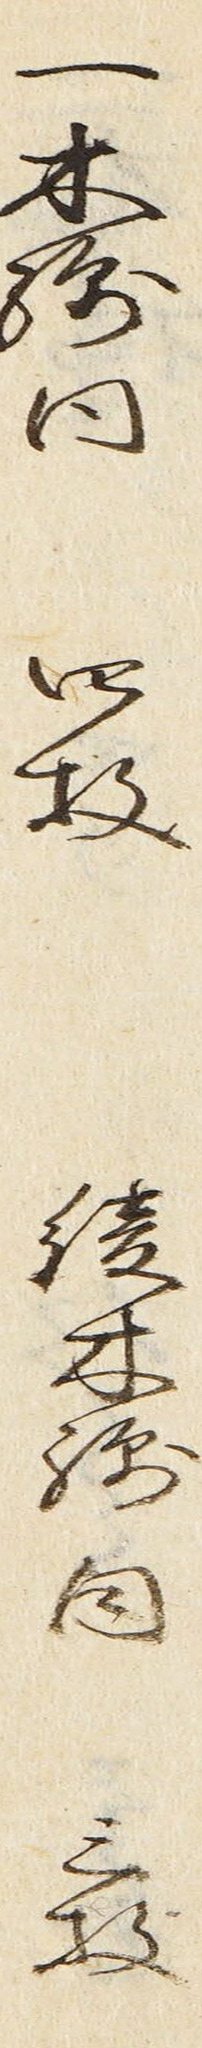一木綿同四枚綾木綿同三枚
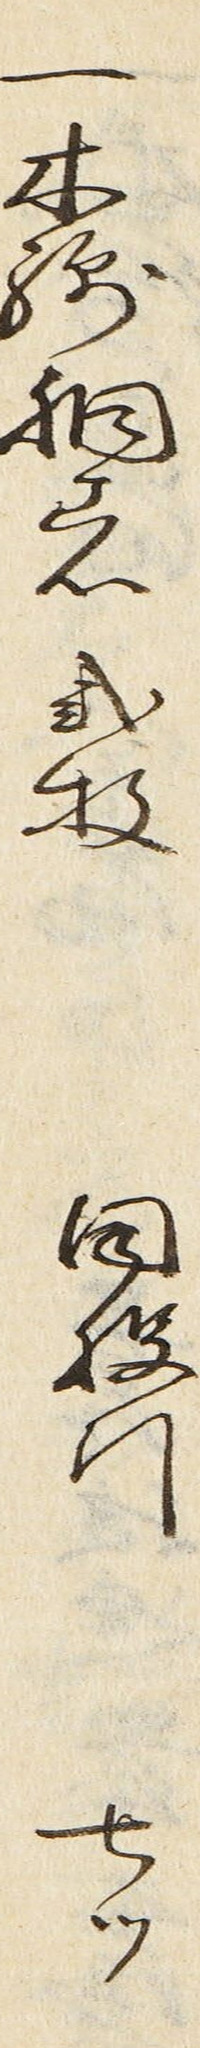一木綿胴着弐枚同股引七ツ
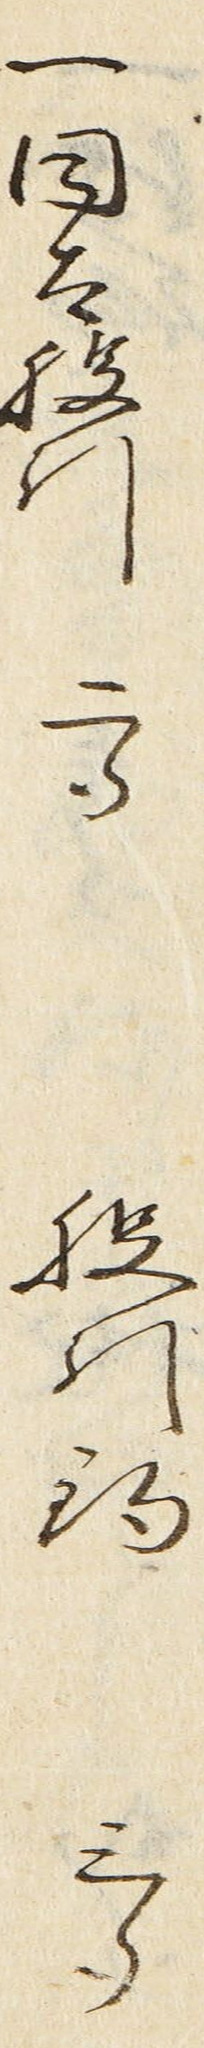一同太股引二ツ股引釣三ツ

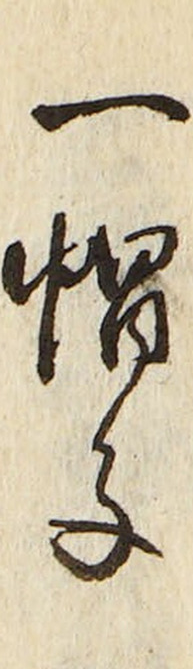一帽子
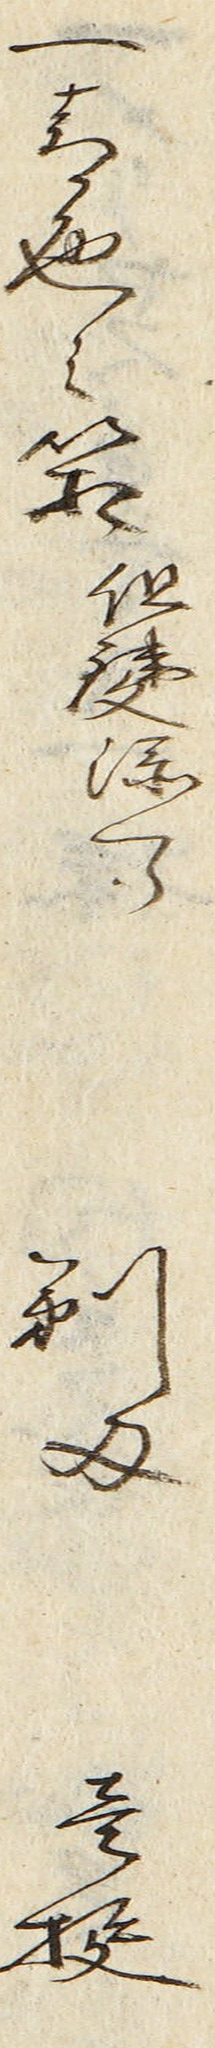一青色之箱但鍵添一ツ剃刀壱挺
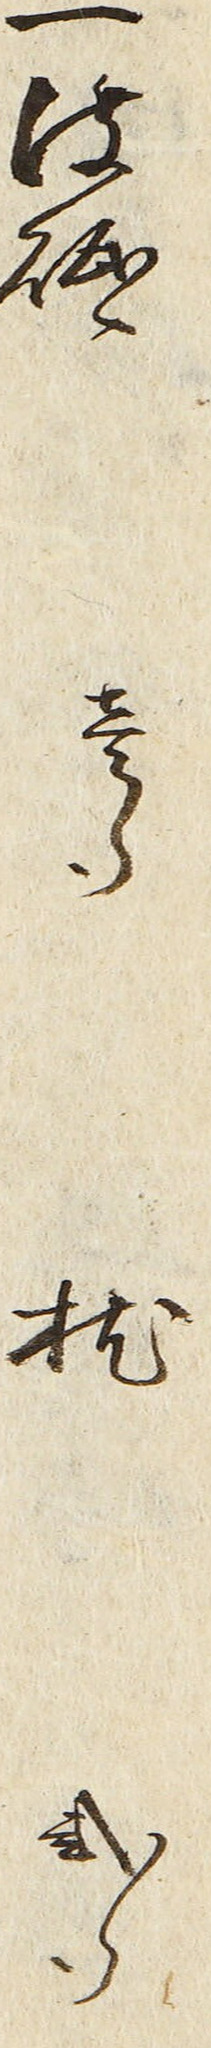一波砥壱ツ枕弐ツ
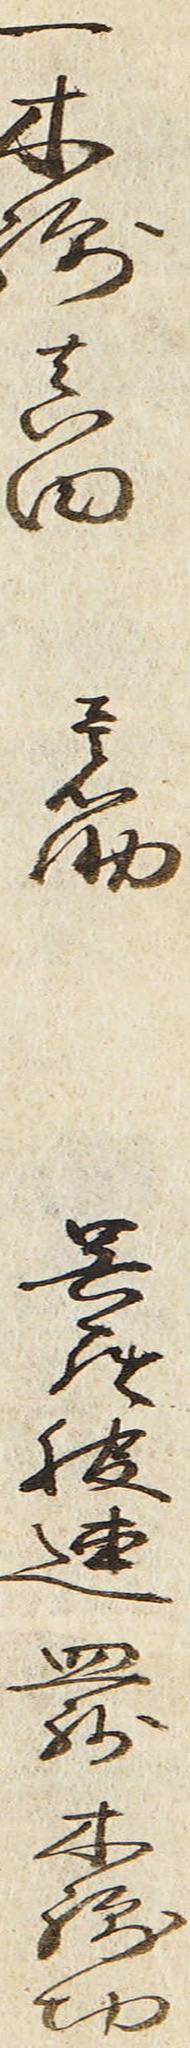一木綿真田壱筋呉羅服連皿紗木綿切々
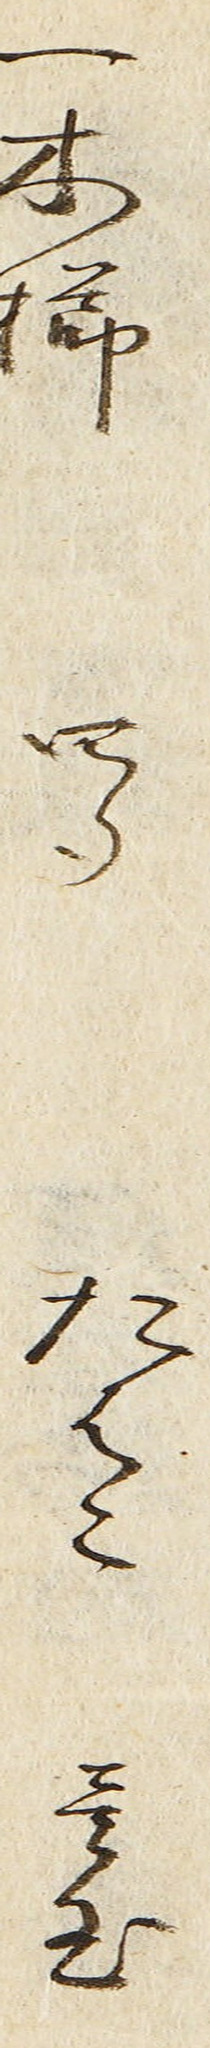一木櫛四ツたはこ壱玉
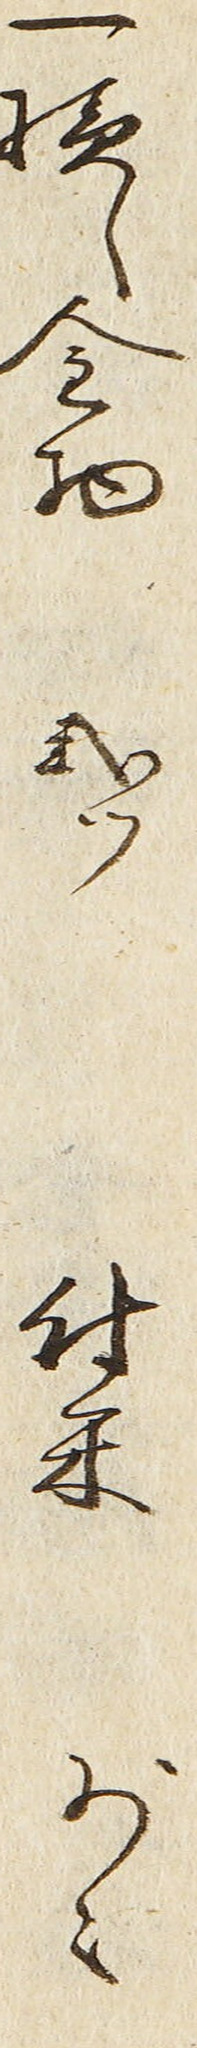一積し金物弐ツ付米少々
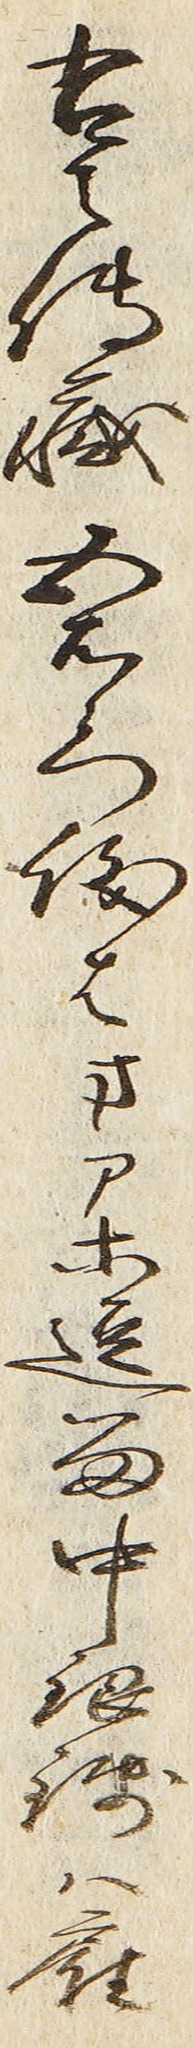右は伝蔵五右衛門儀はオアホ逗留中銀銭は雇
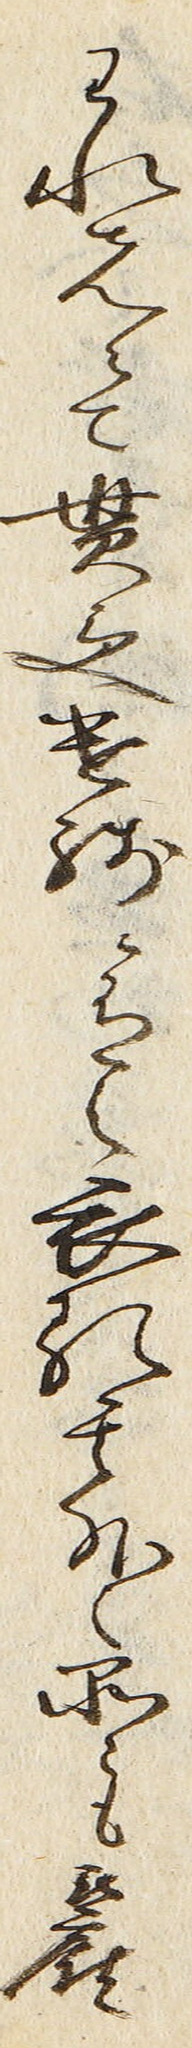われ先にて貰受遣残に有之衣類其外之品々も被雇
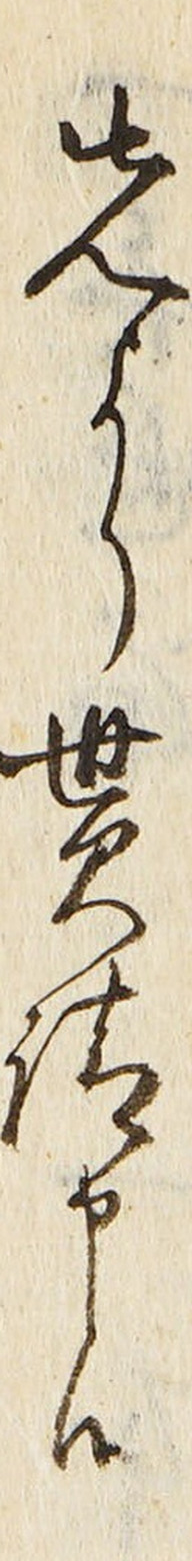先より貰請申候
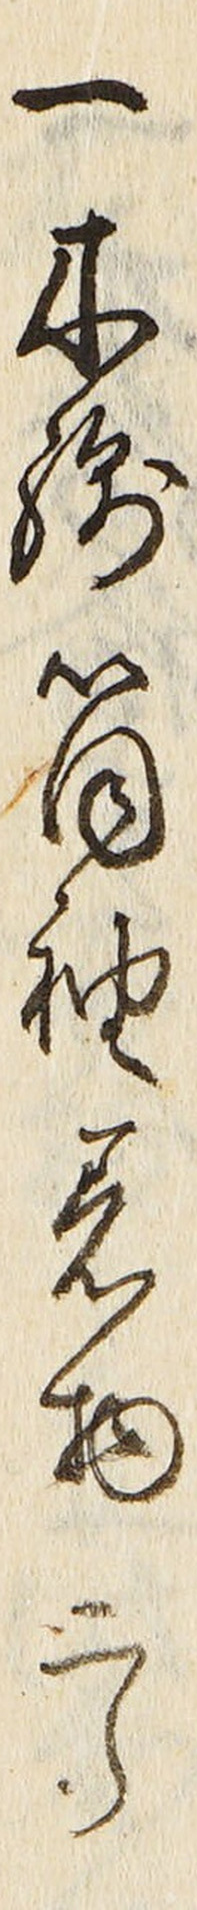一木綿筒袖着物二ツ
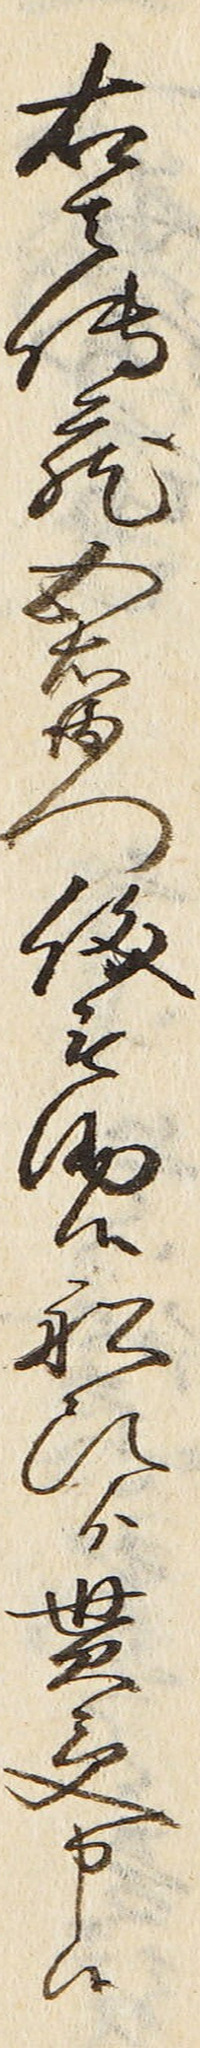右は伝蔵五右衛門儀被助候船頭ゟ貰受申候
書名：土佐中浜万次郎漂流記
